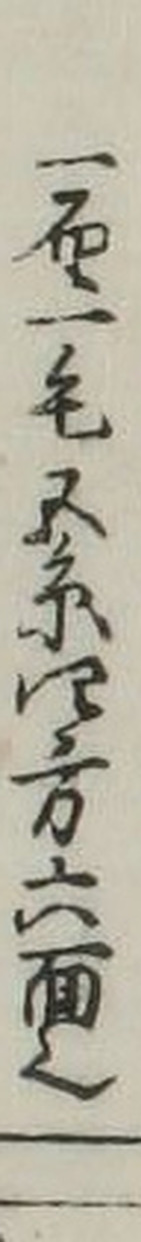一厘一毛五糸四方六面也
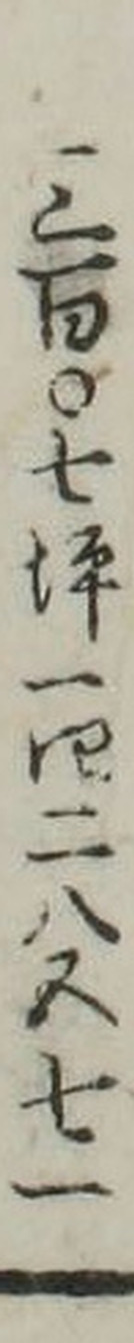三百〇七坪一四二八五七一
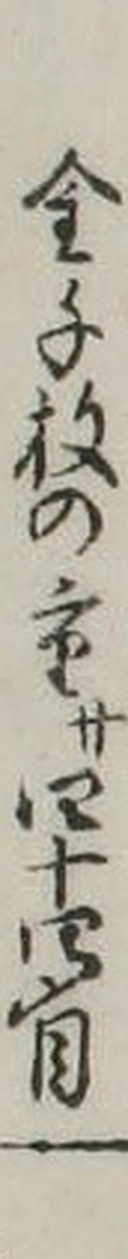金千枚の重サ四十四貫目
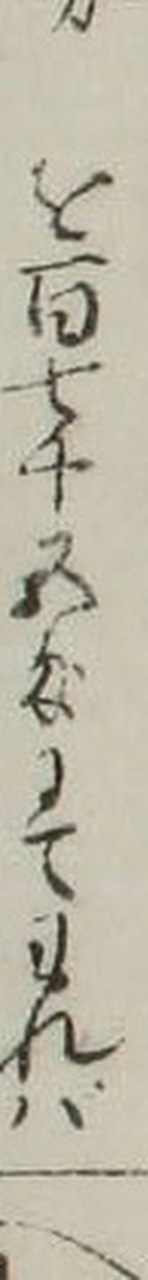を百七十五匁にてわれば
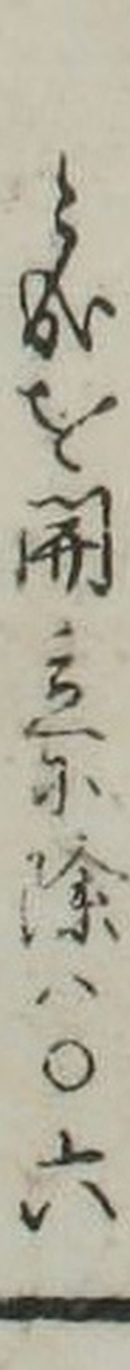と成を開立に除は〇六
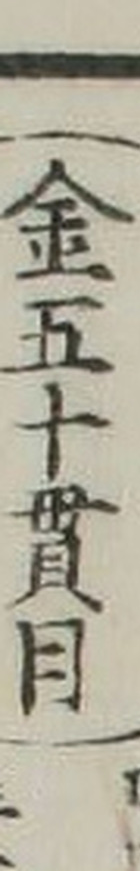銀五十貫目
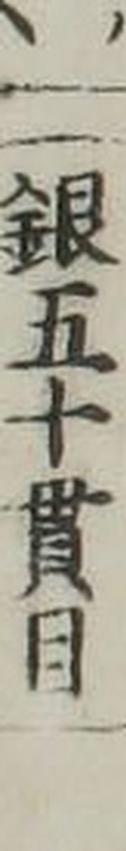銀五十貫目
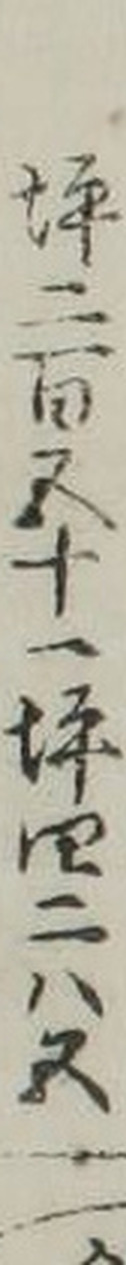坪二百五十一坪四二八五
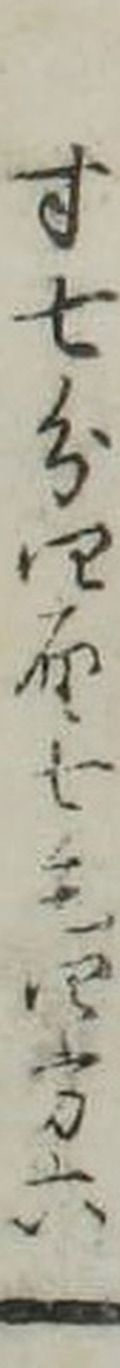寸七分四厘七毛四方六
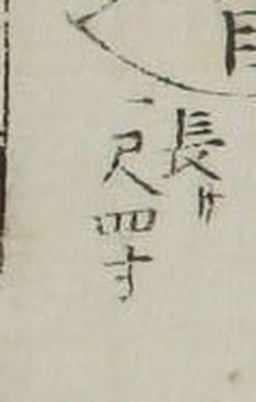一尺四寸
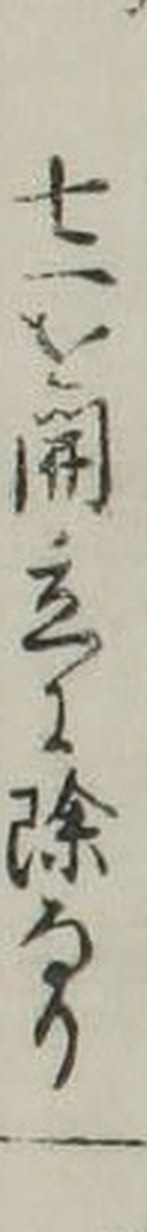七一を開立に除なり
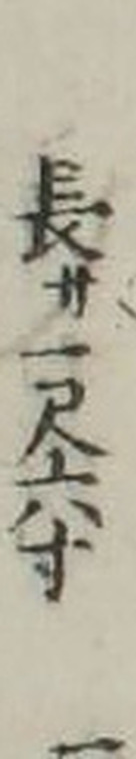長サ一尺六寸
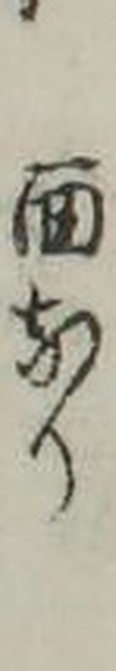面なり

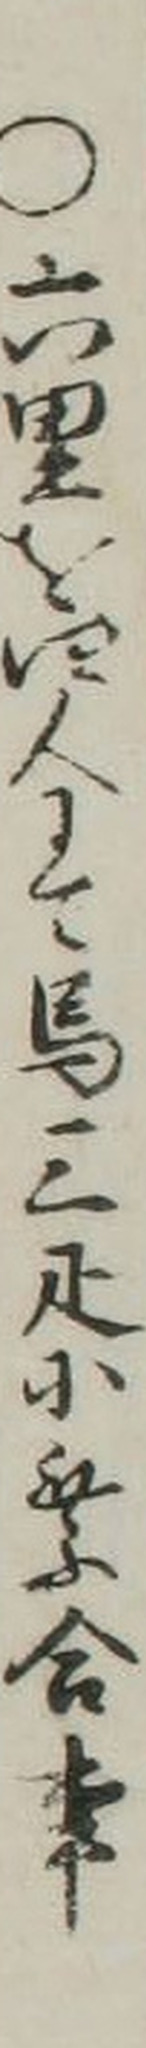○六里を四人にて馬三疋に乗合事
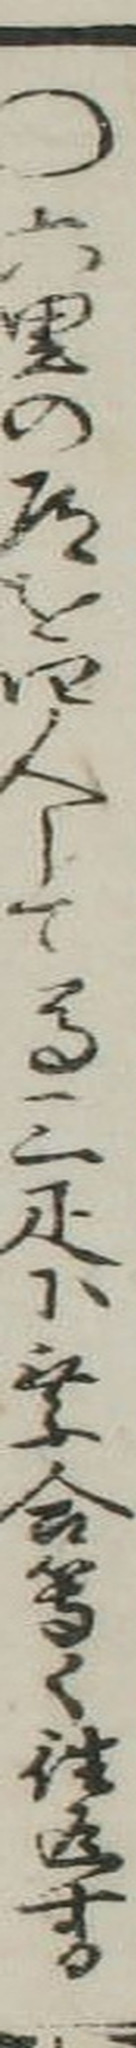○六里の道を四人して馬三疋に乗合等く往道する
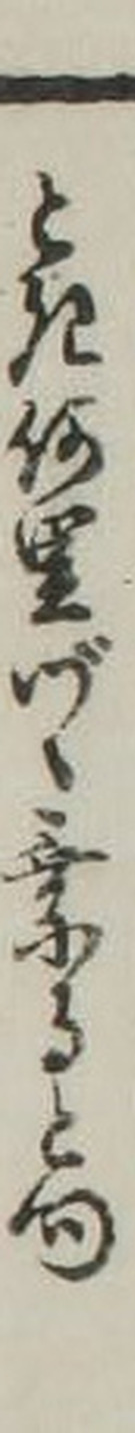とき何里づゝ乗ると問
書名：宝玉塵劫記
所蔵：東京学芸大学教育コンテンツアーカイブ
